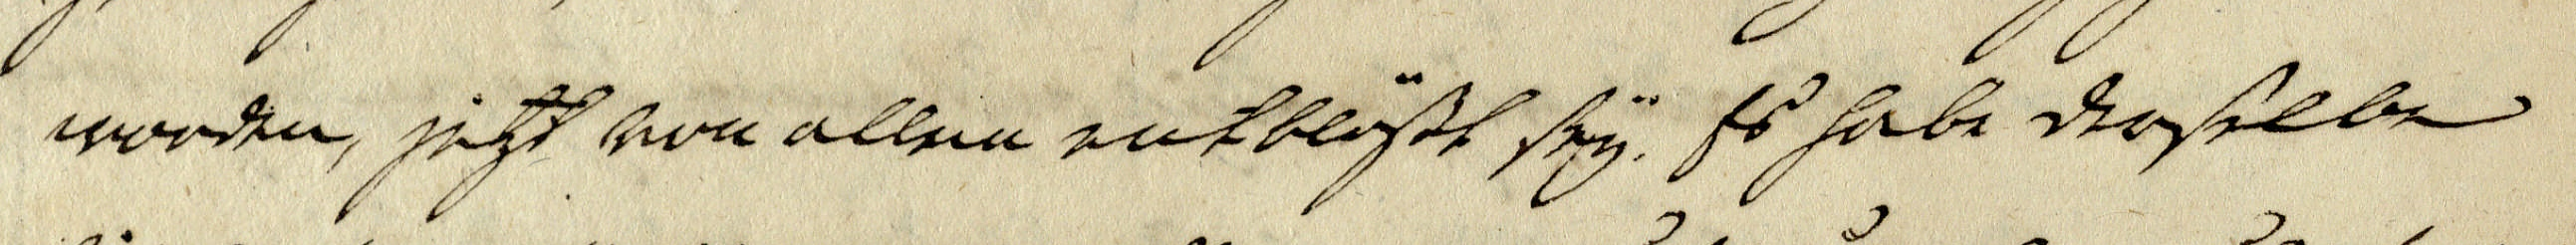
worden, jetzt von allem entblößt seÿ. Es habe derselbe
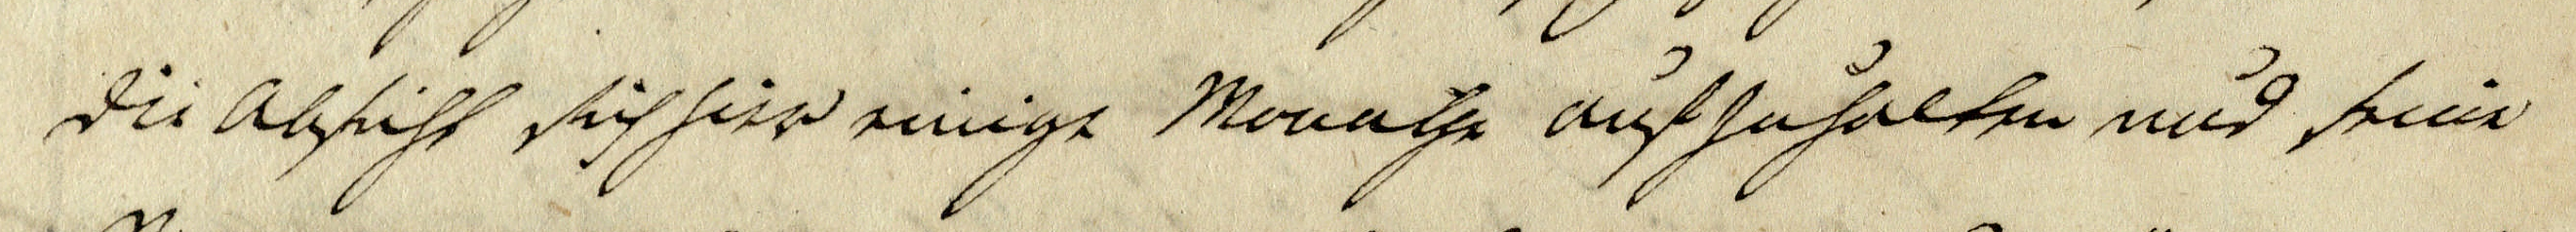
die Absicht sich hier einige Monathe aufzuhalten und seine
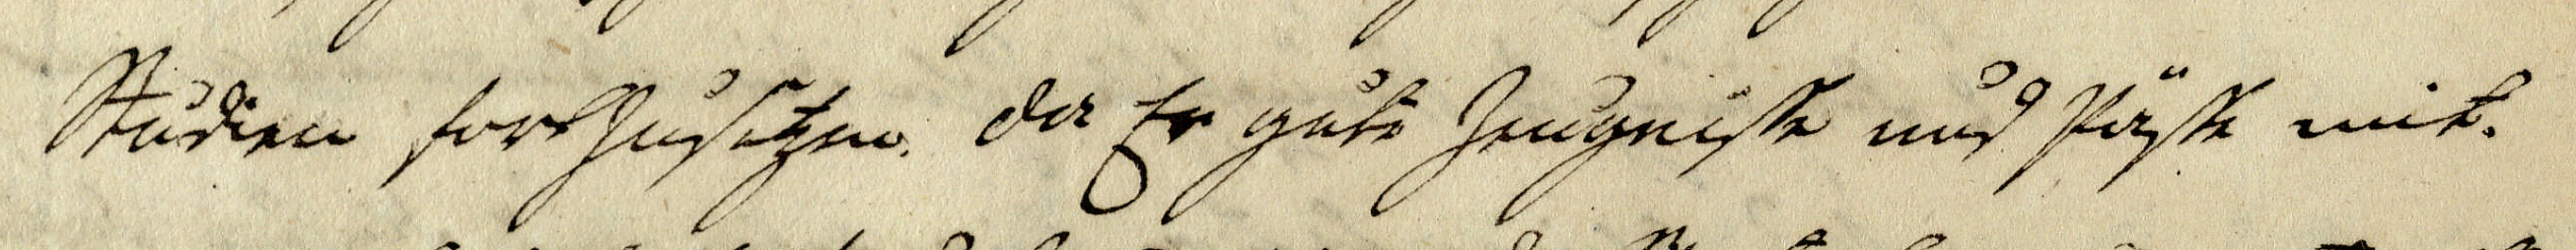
Studien fortzusetzen. Da Er gute Zeugnisse und Pässe mit¬
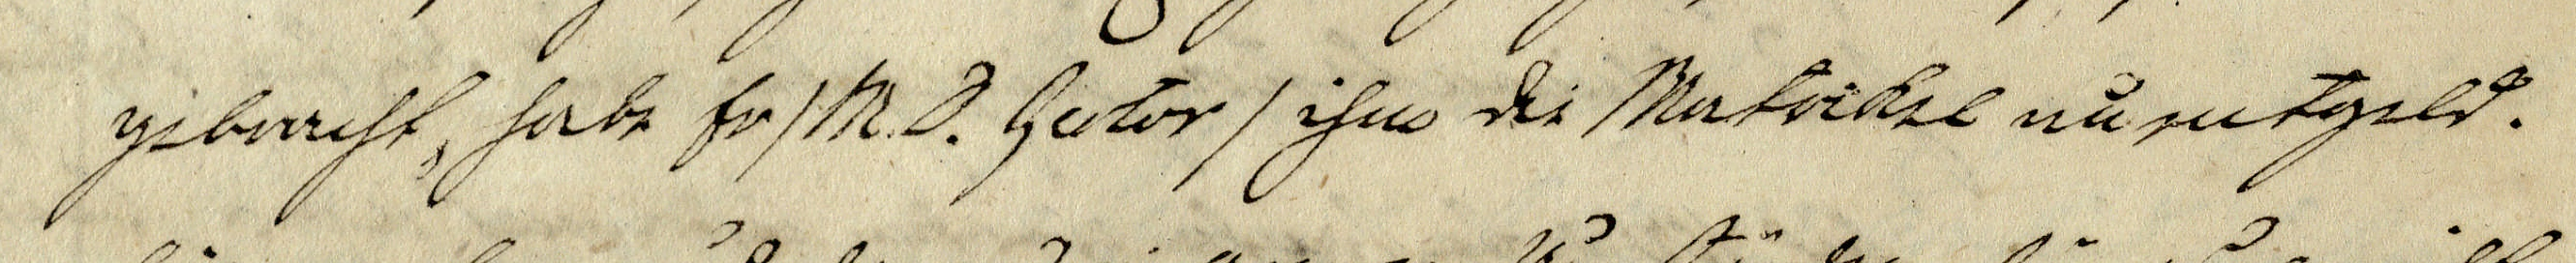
gebracht, habe Er / M. D. Rector / ihm die Matrikel unentgeld¬
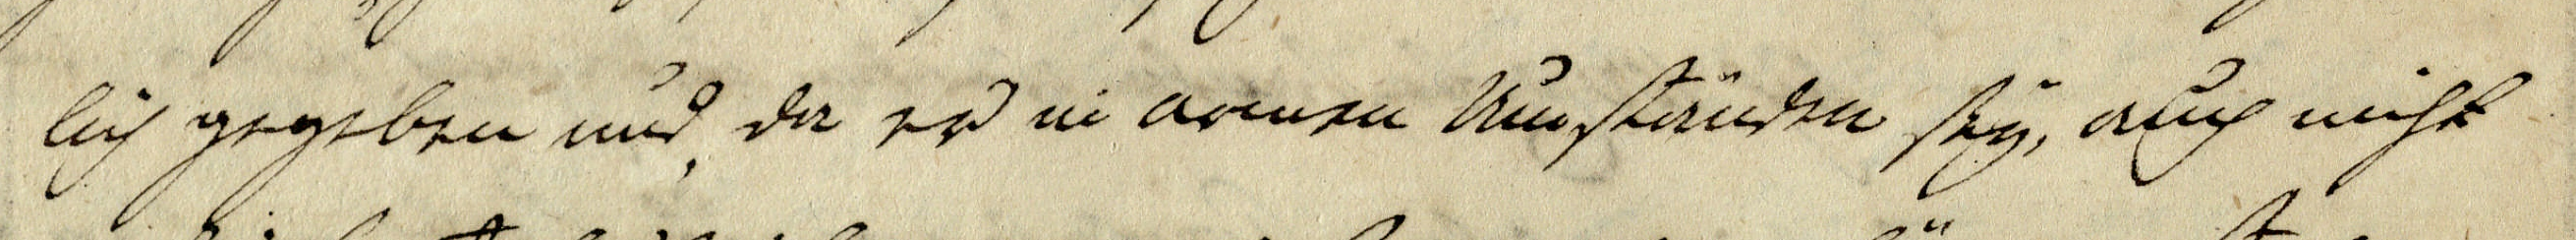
lich gegeben und da er in armen Umständen seÿ, auch nicht
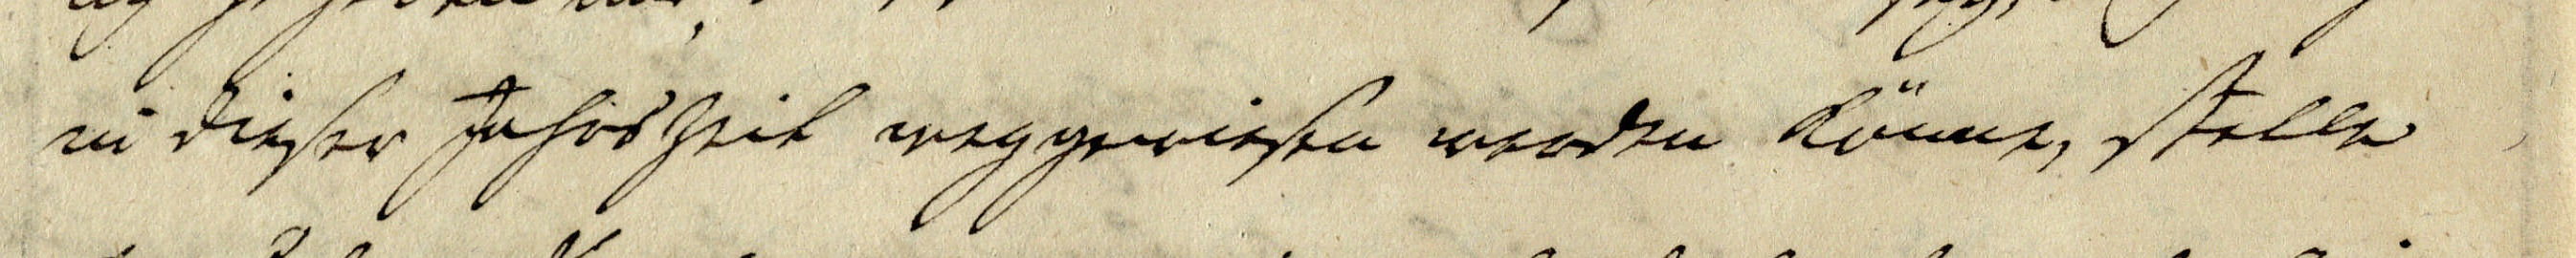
in dieser Jahrszeit weggewiesen werden könne, stelle
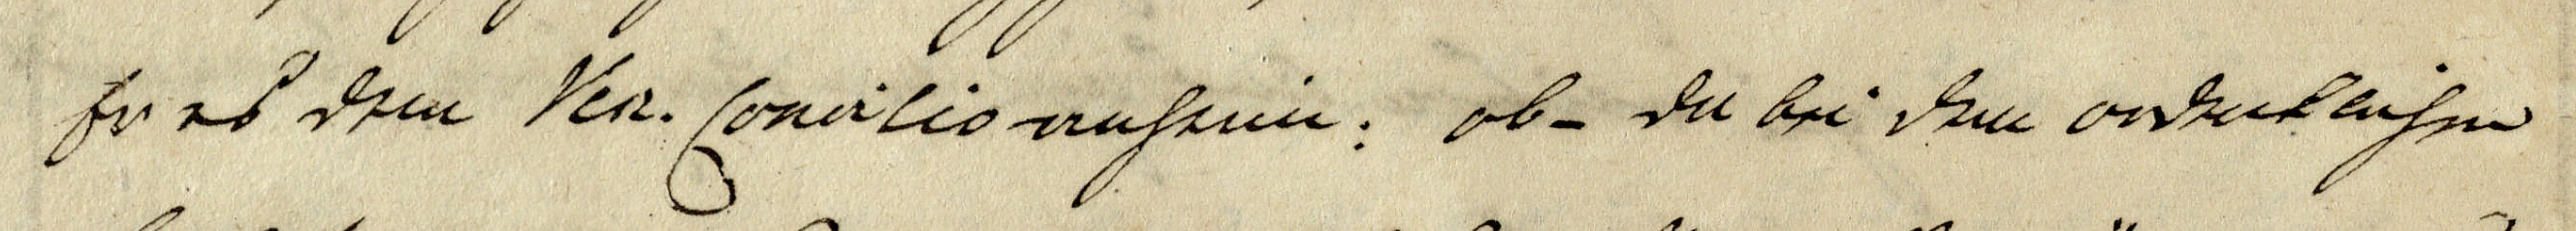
Er es dem Ven. Concilio anheim: ob da bei dem ordentlichen
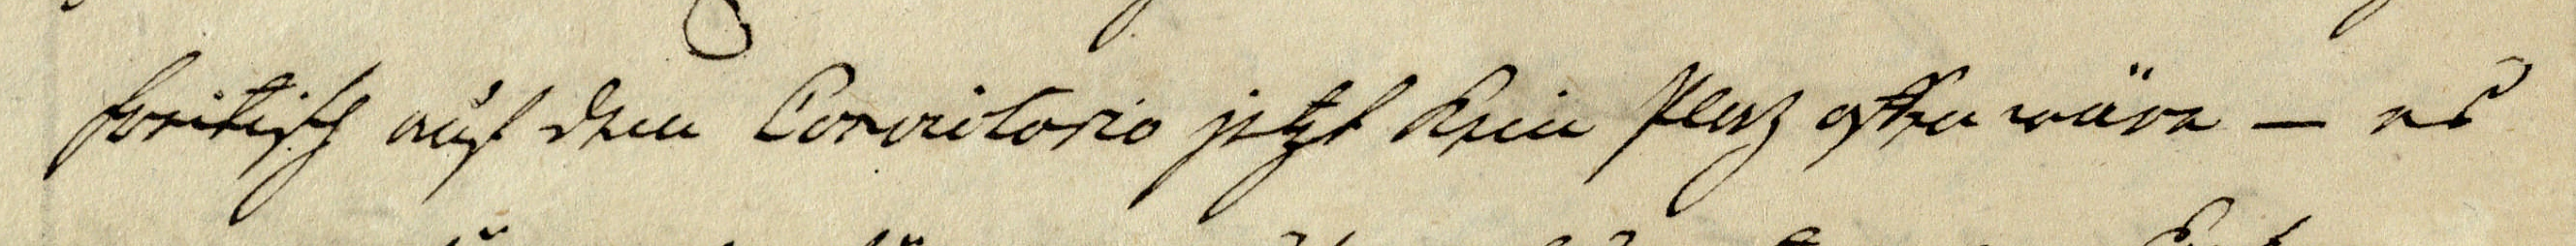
Freitisch auf dem Convictorio jetzt kein Plaz offen wäre es
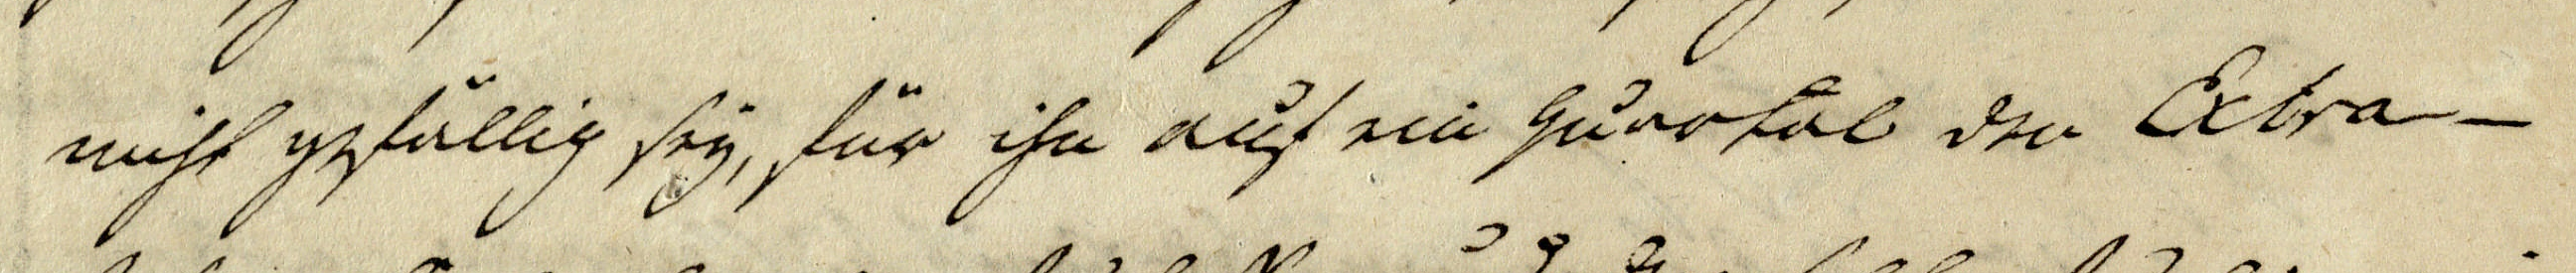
nicht gefällig seÿ, für ihn auf ein Quartal den Exra¬
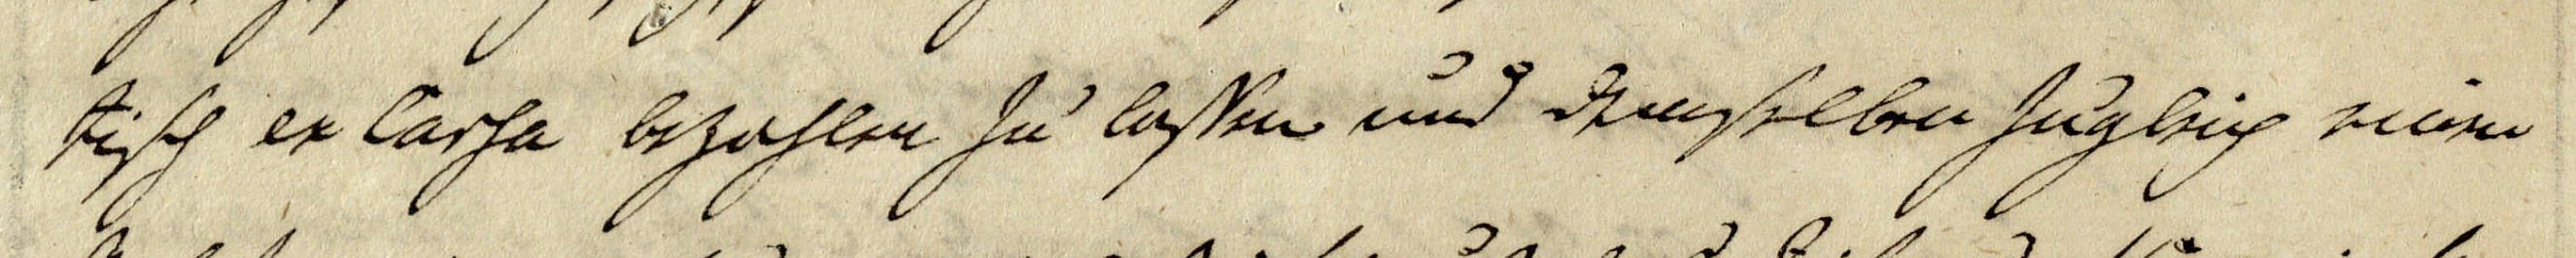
tisch ex Cassa bezahlen zu lassen und demselben zugleich einen
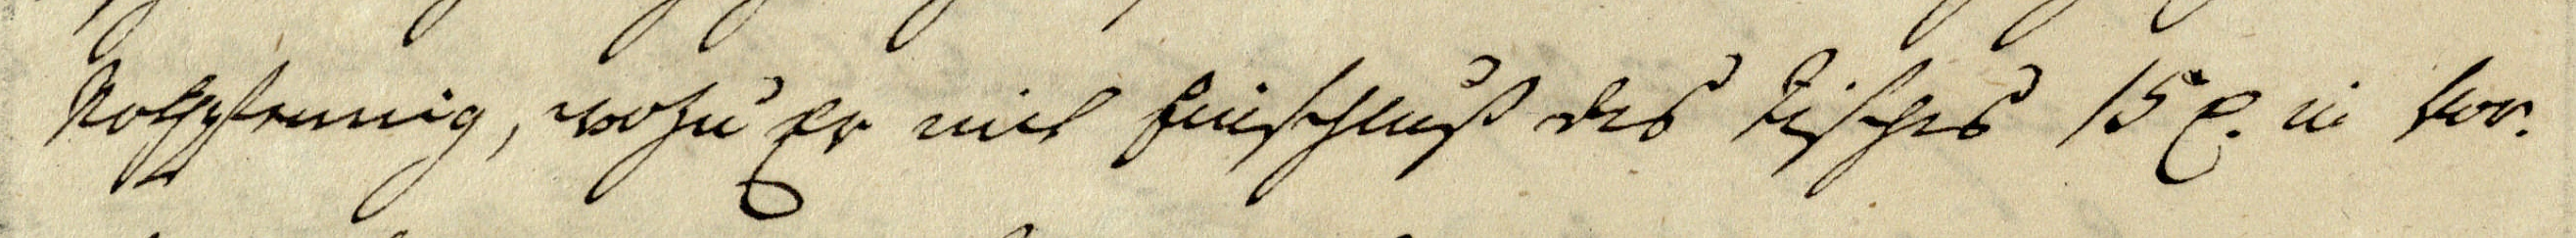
Nothpfennig, wozu Er mit Einschluß des Tisches 15 l. in Vor¬
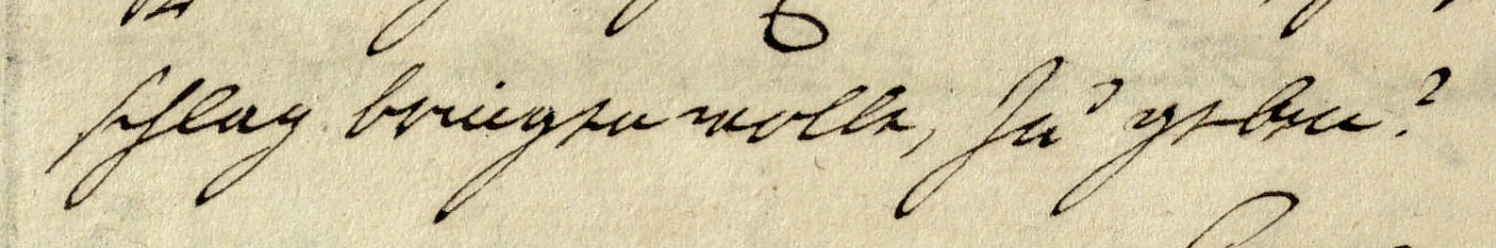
schlag bringen wolle, zu geben?
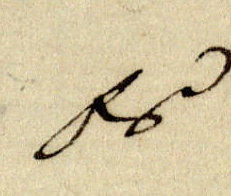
Es
